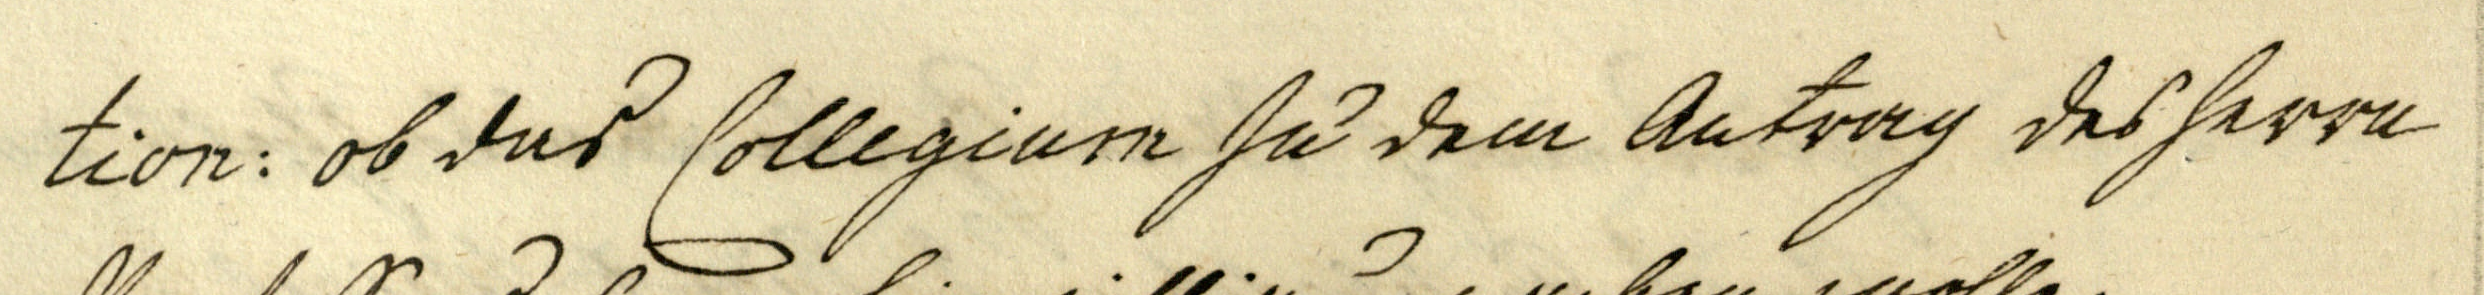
tion: ob das Collegium zu dem Antrag des Herrn
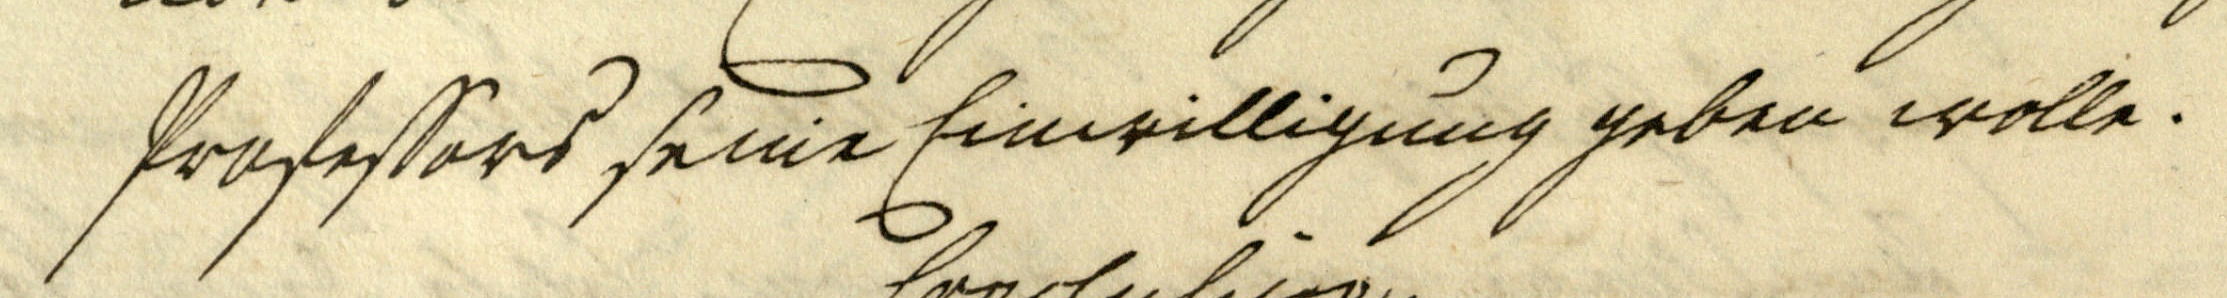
Professors seine Einwilligung geben wolle.
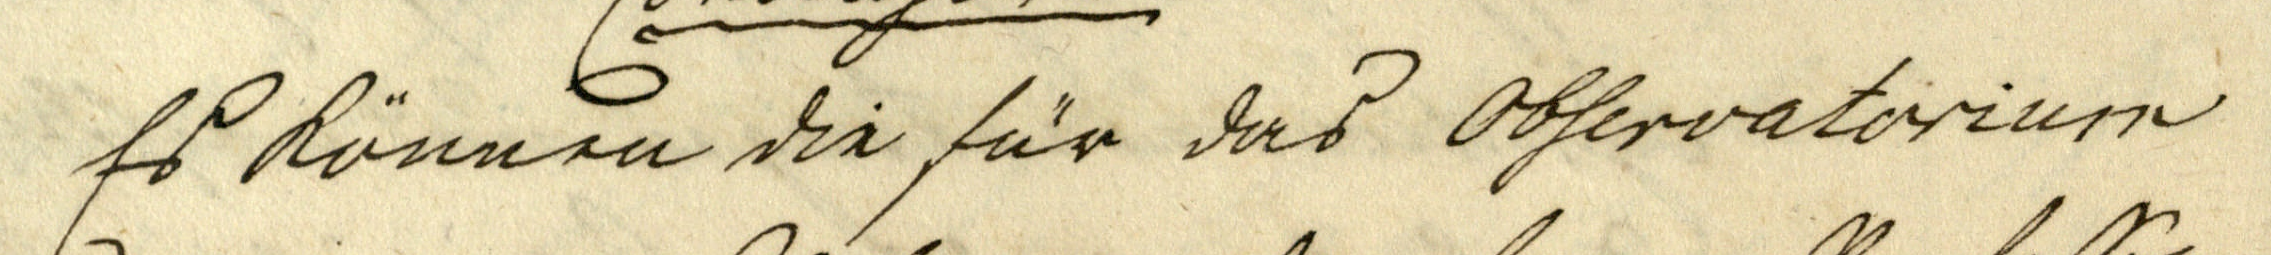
Es können die für das Observatorium
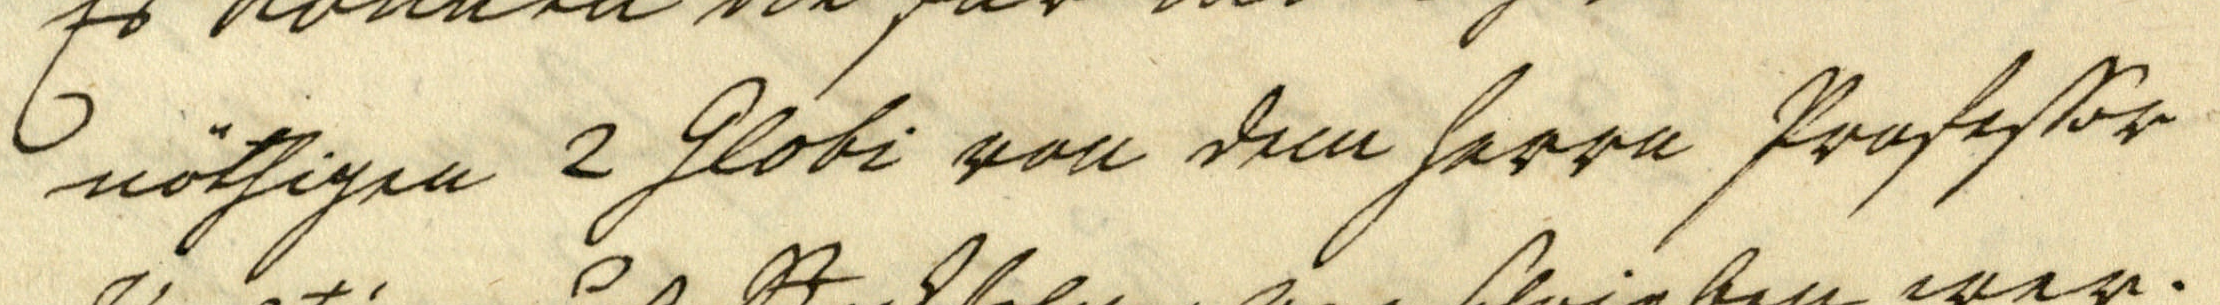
nöthigen 2 Globi von dem Herrn Professor
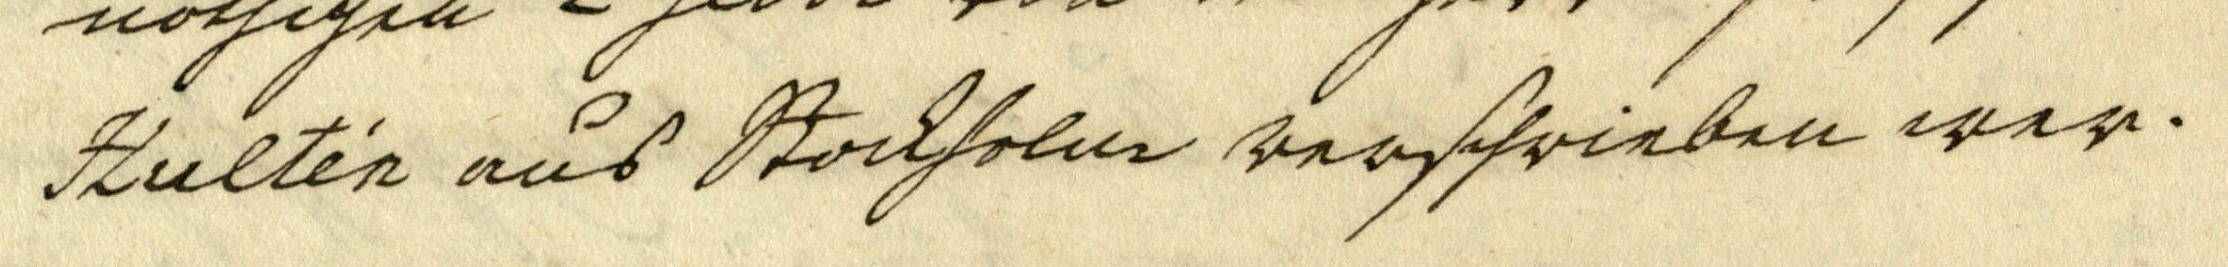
Hultén aus Stockholm verschrieben wer-
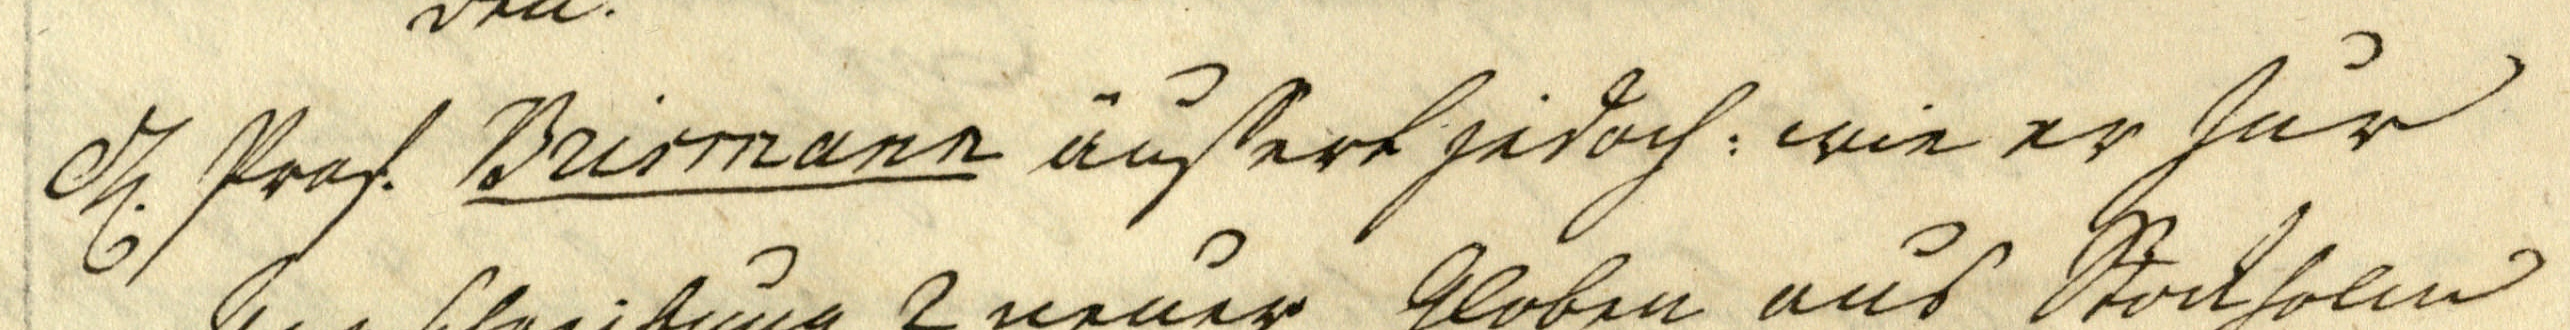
dh. Prof. Brismann äussert jedoch: wie er zur
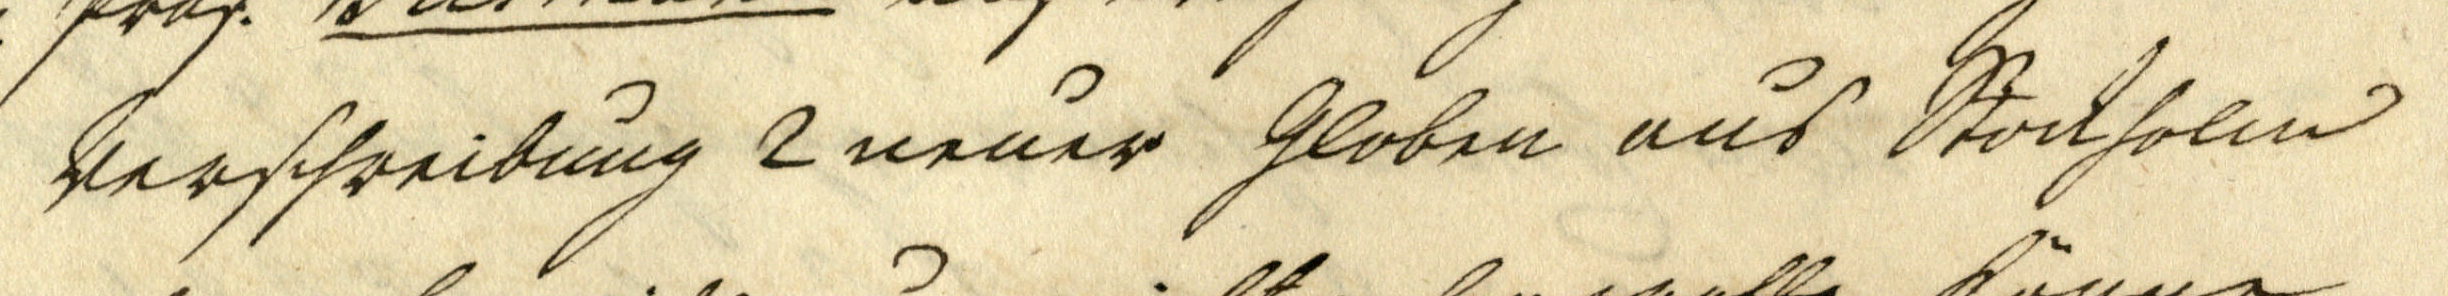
Verschreibung 2 neuer Globen aus Stockholm
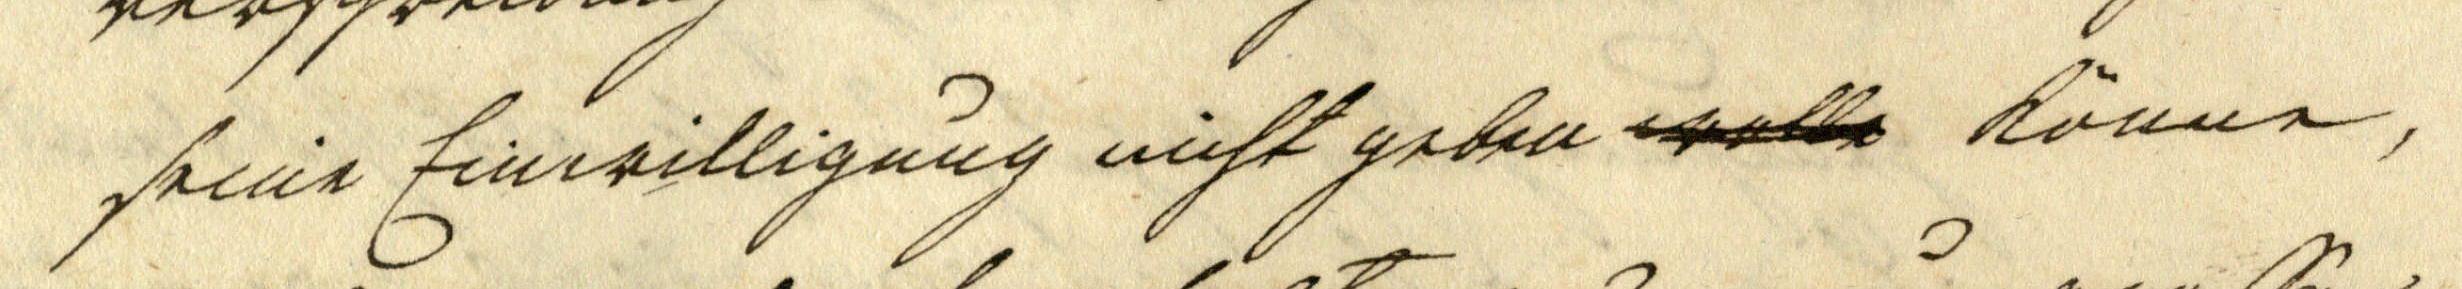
seine Einwilligung nicht geben wolle könne,
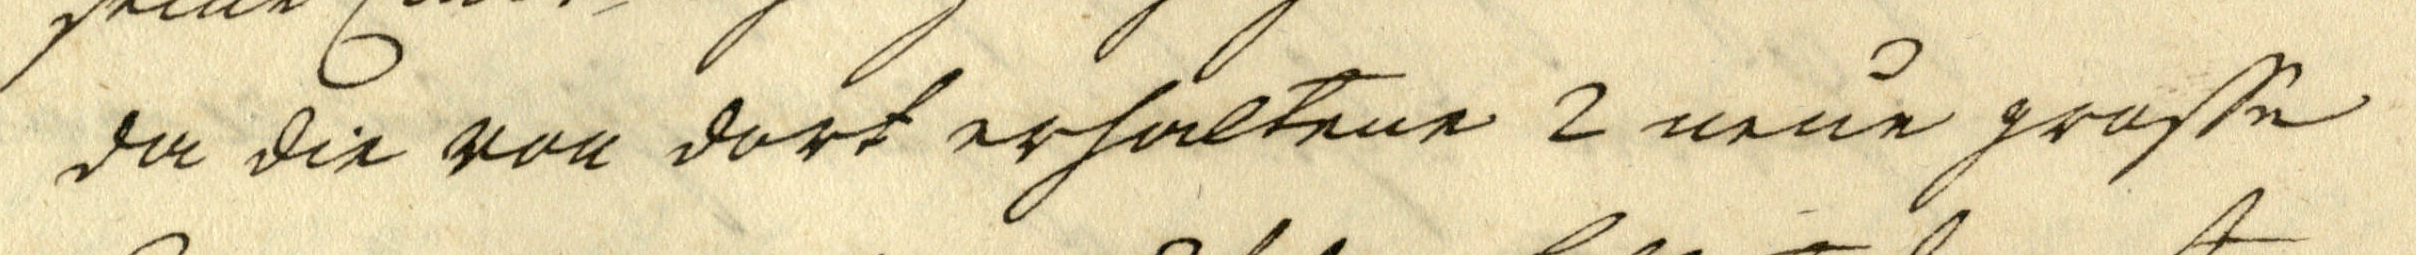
da die von dort erhaltene 2 neue grosse
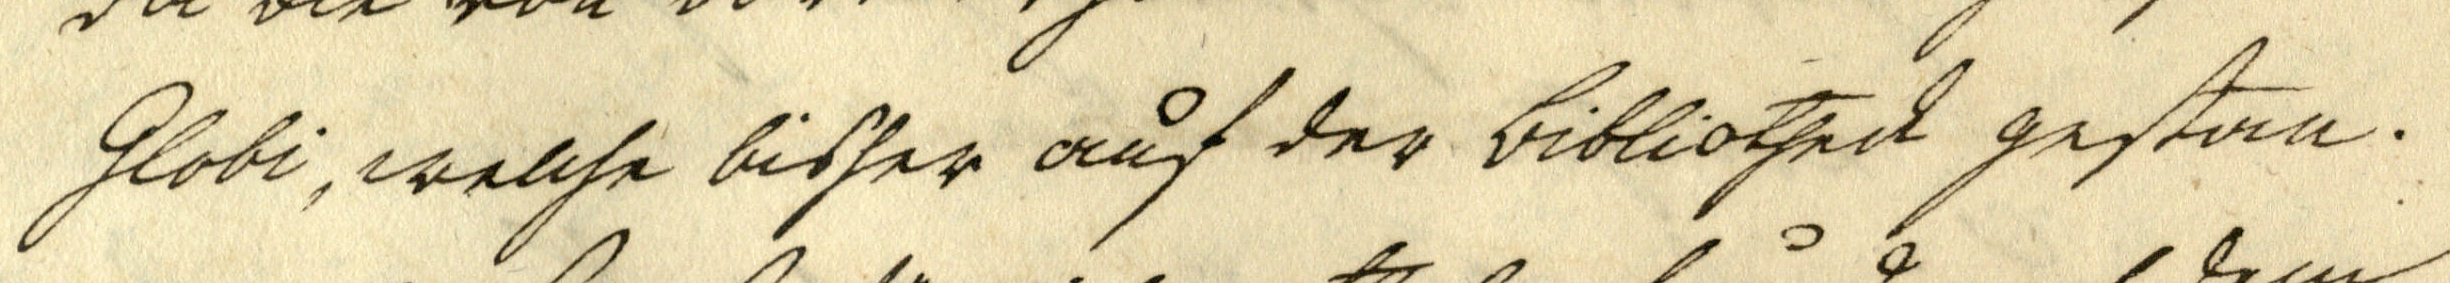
Globi, welche bisher auf der Bibliotheck gestan¬
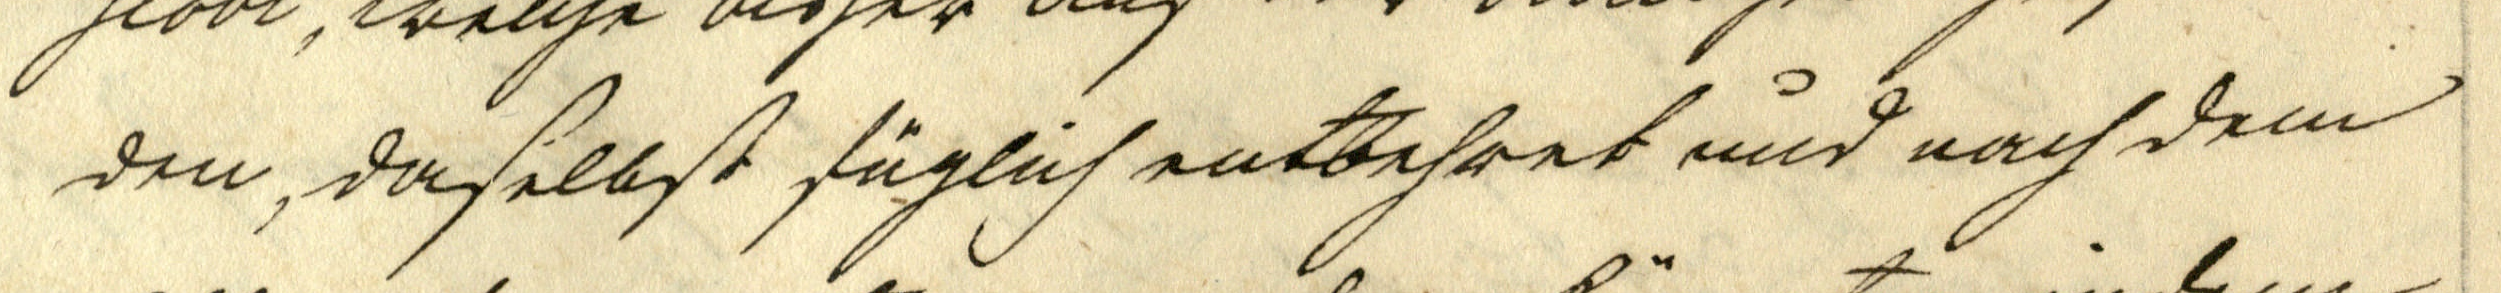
den, daselbst füglich entbehret und nach dem
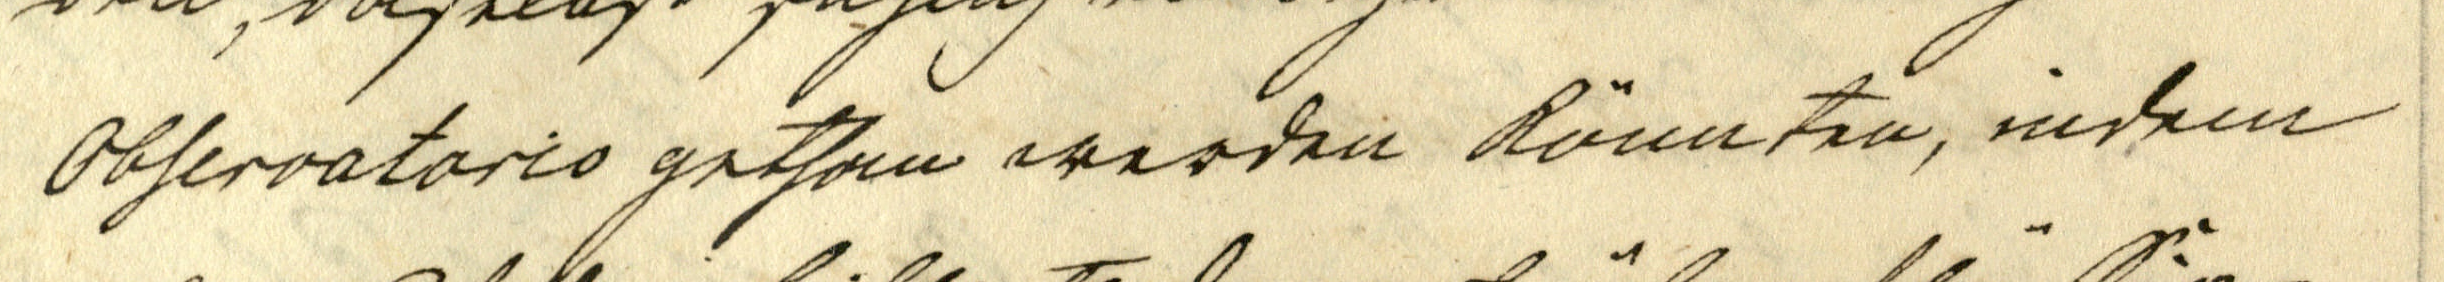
Observatario gethan werden könnten, indem
